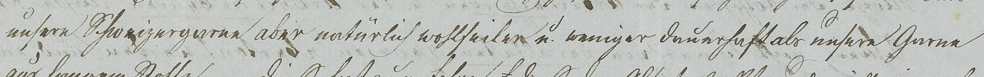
unsere Schweizergarne aber natürlich wohlfeiler u. weniger dauerhaft als unsere Garne
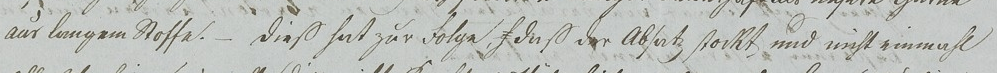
aus langem Stoffe. – Dieß hat zur Folge, daß der Absatz stockt und nicht einmahl
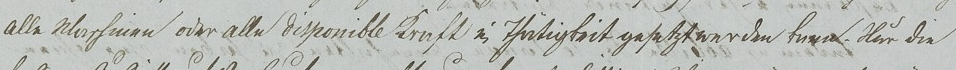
alle Maschinen oder alle disponible Kraft in Thätigkeit gesetzt werden kann. Nur die
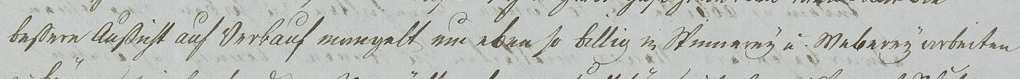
bessere Aussicht auf Verkauf mangelt um eben so billig in Spinnerey u. Weberey arbeiten
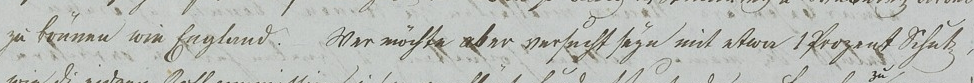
zu können wie England. Wer möchte aber versucht seyn mit etwa 1 Prozent Schutz,
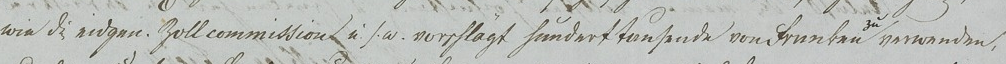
wie die eidgen. Zollcommission u. s. w. vorschlägt hunderttausende von Franken zu verwenden,
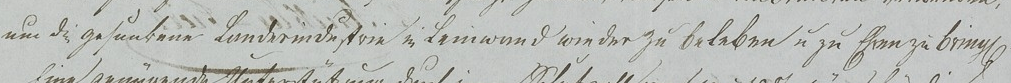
um die gesunkene Landesindustrie in Leinwand wieder zu beleben u zu Ehren zu bringen.
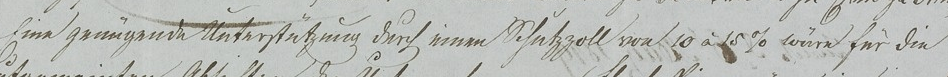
Eine genügende Unterstützung durch einen Schutzzoll von 10 à 15% wäre für die
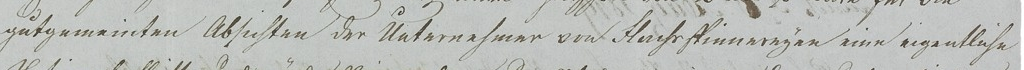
gutgemeinten Absichten der Unternehmer von Flachsspinnereyen eine eigentliche
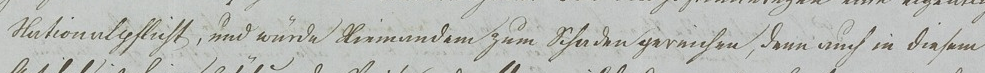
Nationalpflicht, und würde Niemandem zum Schaden gereichen, denn auch in diesem
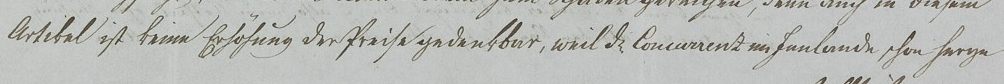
Artikel ist keine Erhöhung der Preise gedenkbar, weil die Concurrenz im Innlande schon herge-
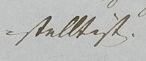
stellt ist.
